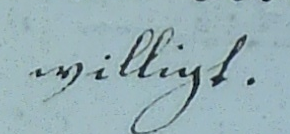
willigt.
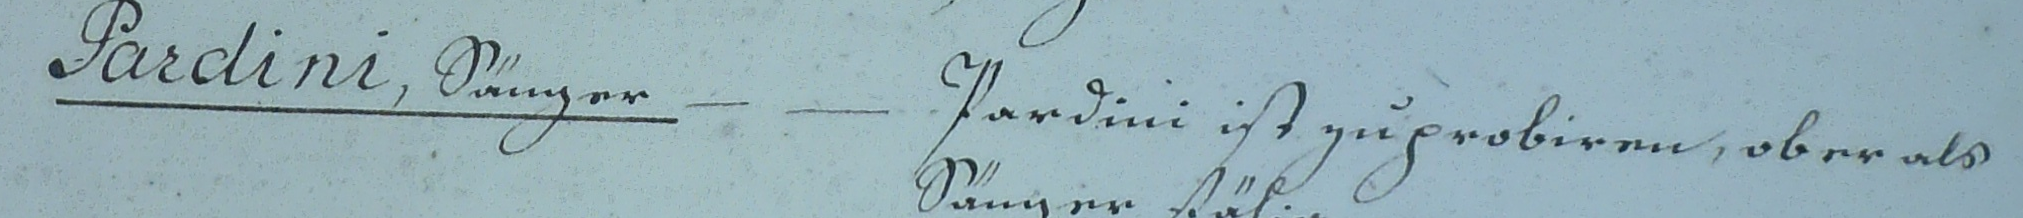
Pardini, Sänger _ _ Pardini ist zuprobiren, ob er als
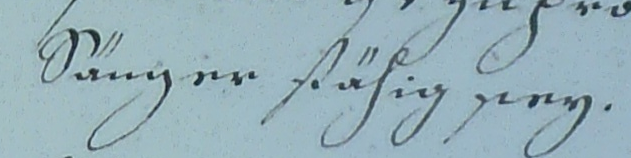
Sänger fähig sey.
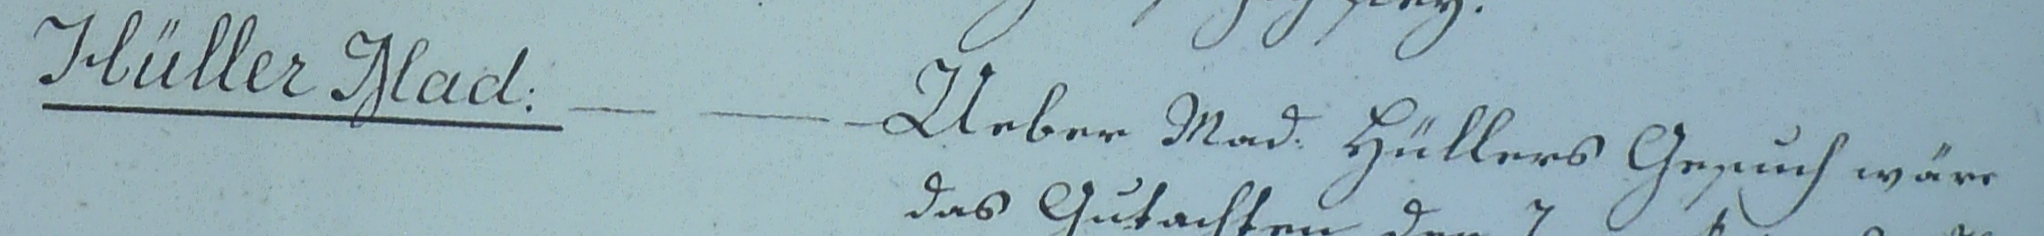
Hüller Mad: _ __ _ Ueber Mad: Hüllers Gesuch wäre
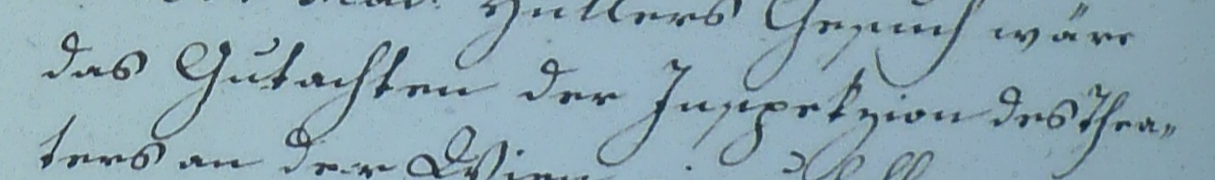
das Gutachten der Inspekzion des Thea¬
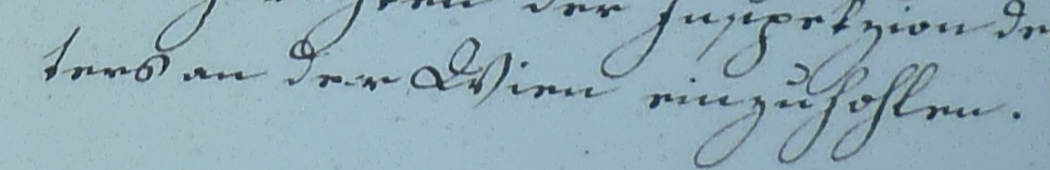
ters an der Wien einzuhohlen.
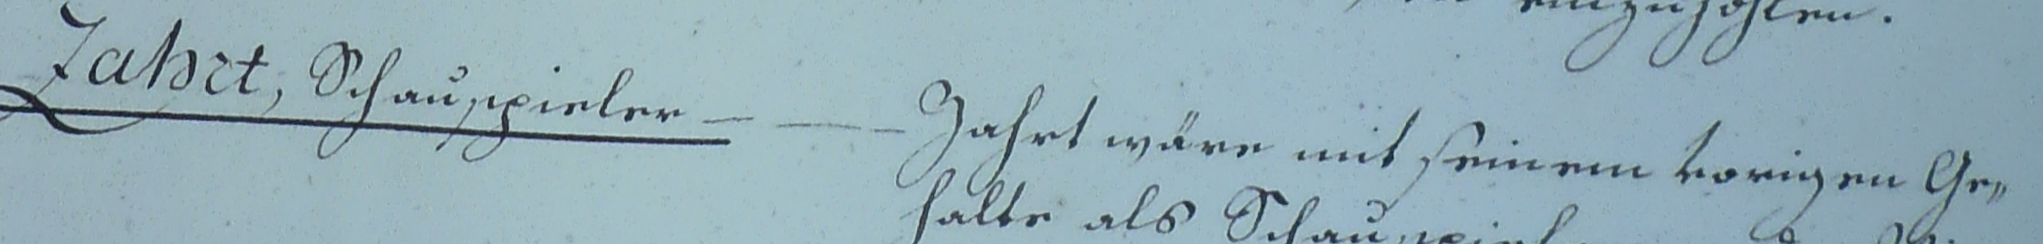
Zahrt, Schauspieler _ __ _ Zahrt wäre mit seinem vorigen Ge¬
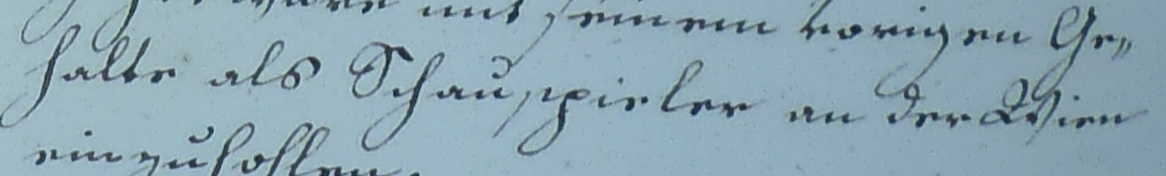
halte als Schauspieler an der Wien
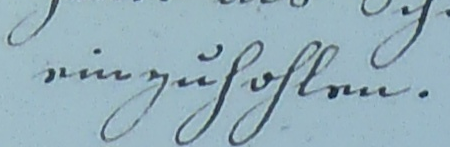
einzuhohlen.
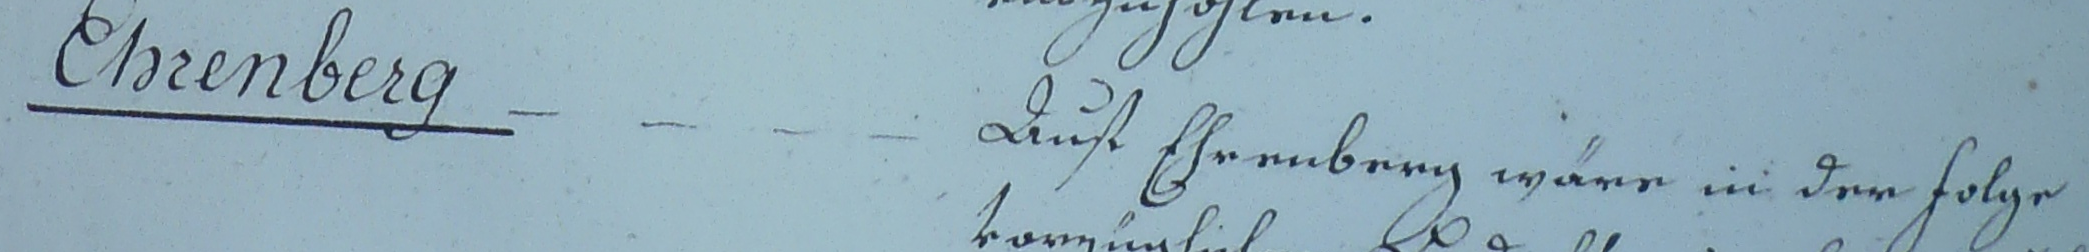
Ehrenberg _ _ _ _ Auf Ehrenberg wäre in der Folge
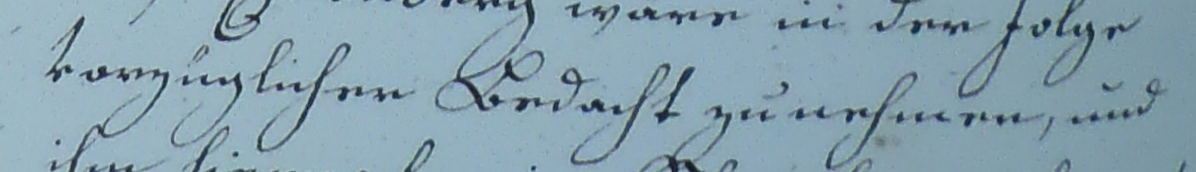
vorzüglicher Bedacht zunehmen, und
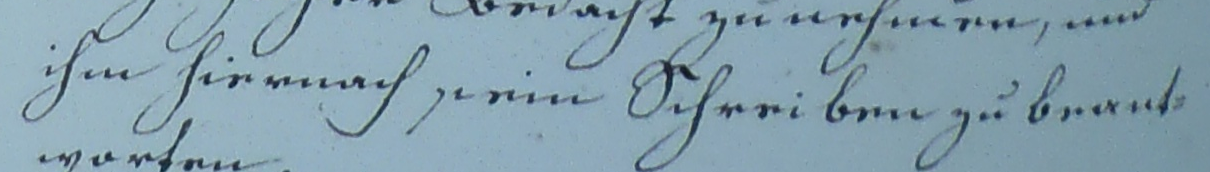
ihm hirnach sein Schreiben zu beant¬
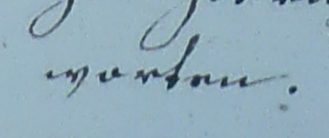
worten.
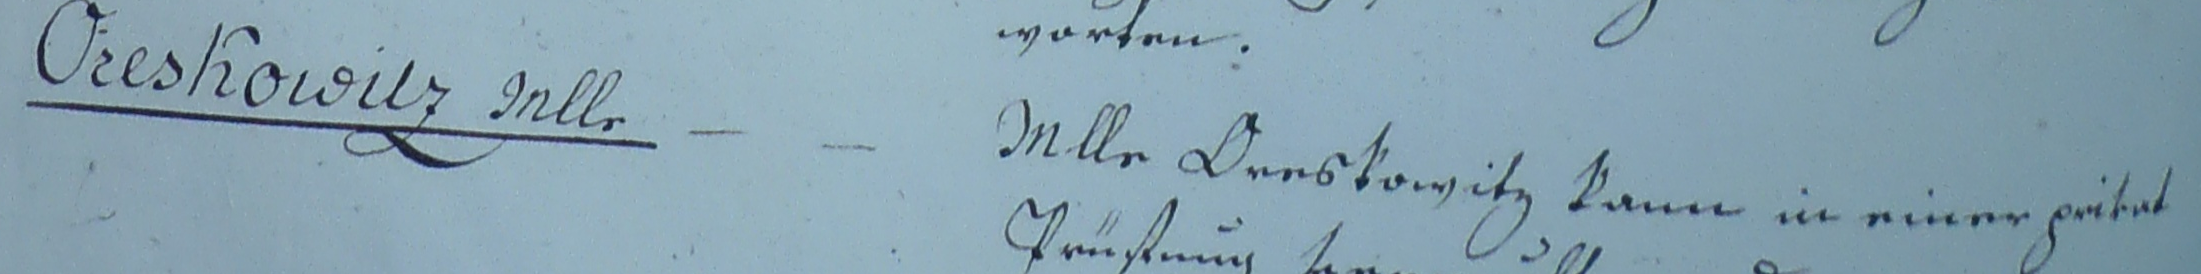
Oreskowitz Mlle _ _ Mlle Oreskowitz kann in einer privat
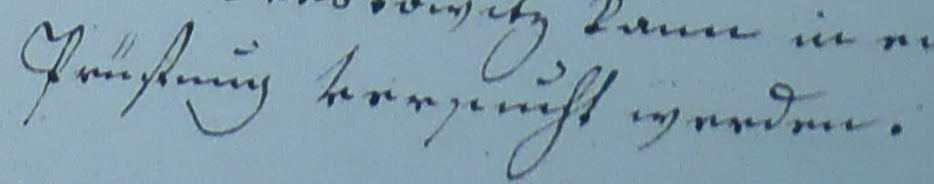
Prüfung versucht werden.
